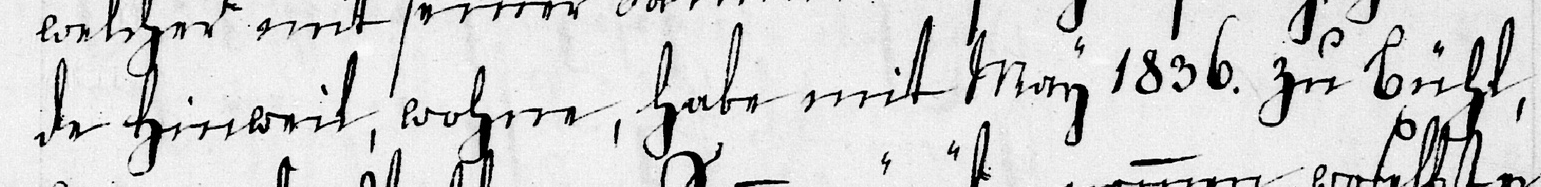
de Hinweil, wohne, habe mit May 1836. zu Bühl,
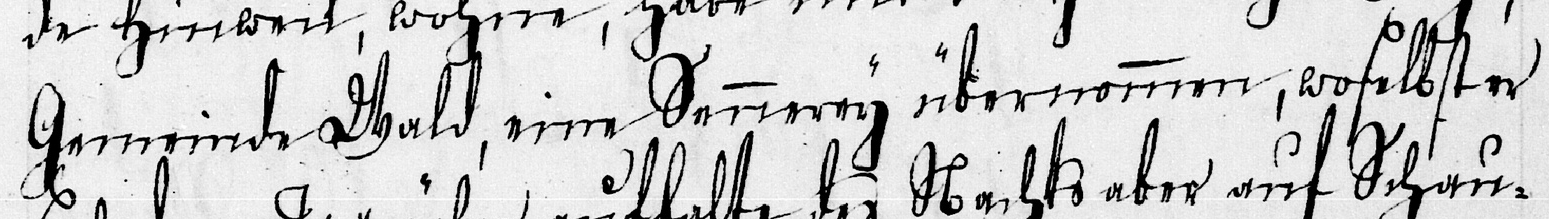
Gemeinde Wald, eine Sennerey übernommen, woselbst er
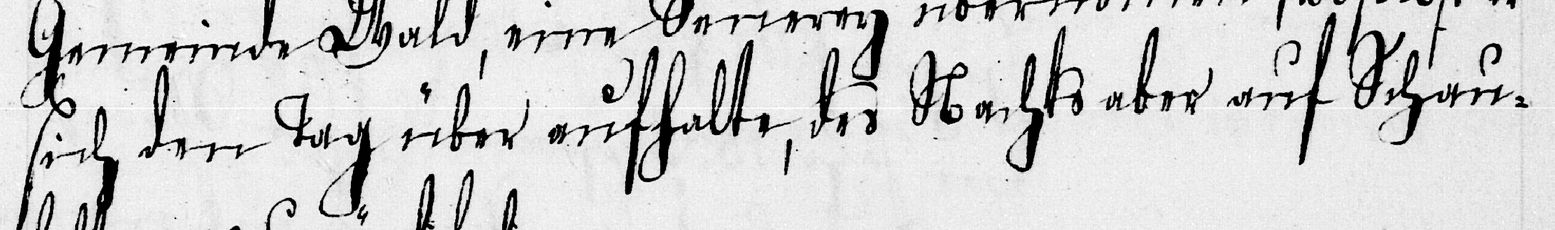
sich den Tag über aufhalte, des Nachts aber auf Schau¬
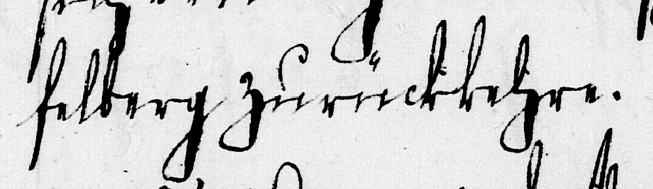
felberg zurückkehre.
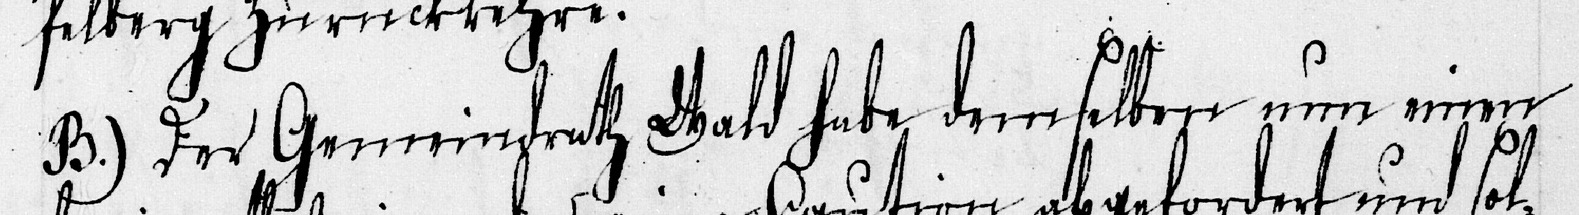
B.) Der Gemeindrath Wald habe demselben nun einen
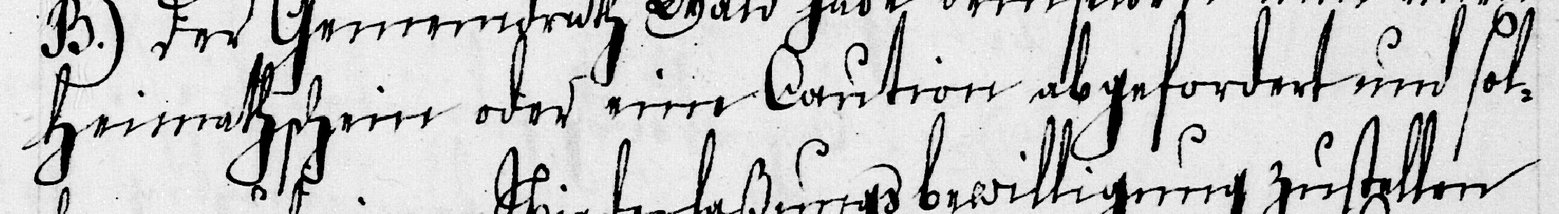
Heimathschein oder eine Caution abgefordert und sol¬
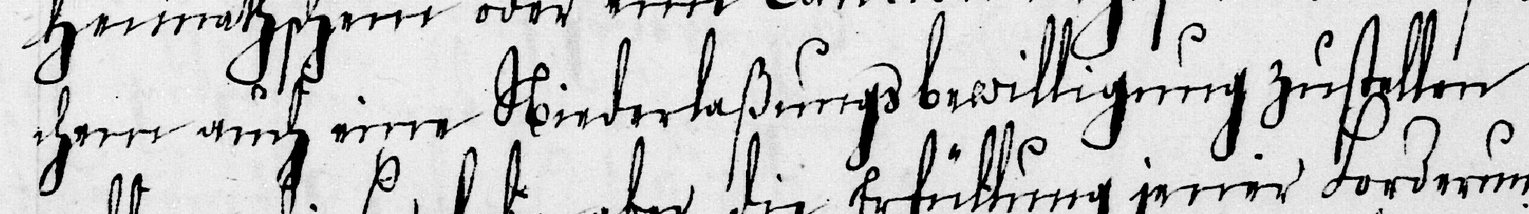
chen auch eine Niederlaßungsbewilligung zustellen
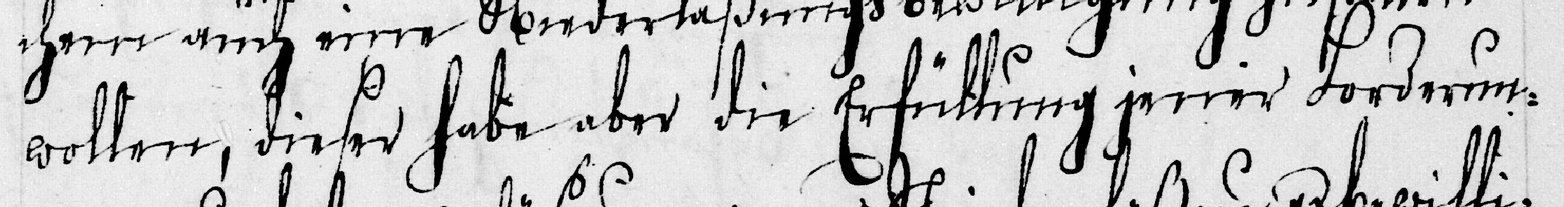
wollen, dieser habe aber die Erfüllung jener Forderun¬
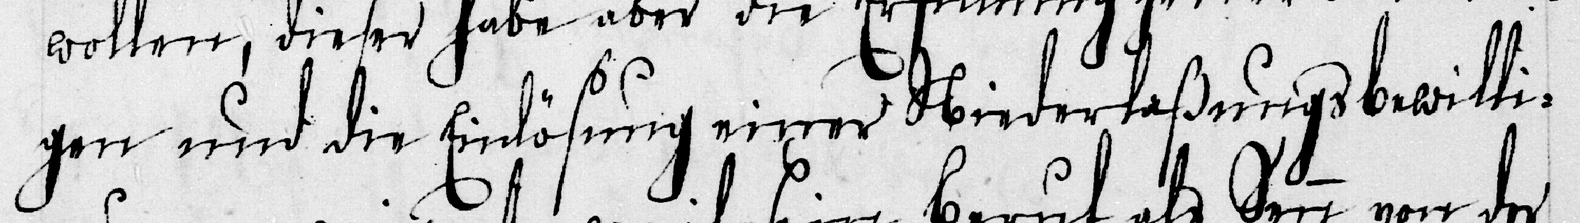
gen und die Einlösung einer Niederlaßungsbewilli¬
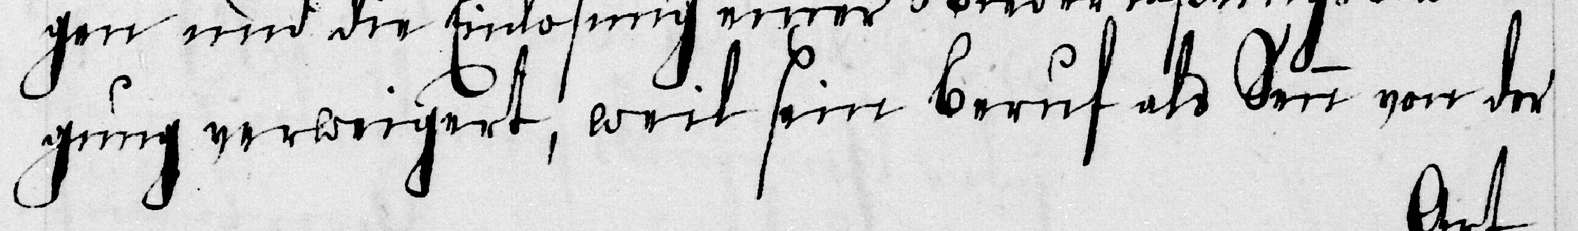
gung verweigert, weil sein Beruf als Senn von der
